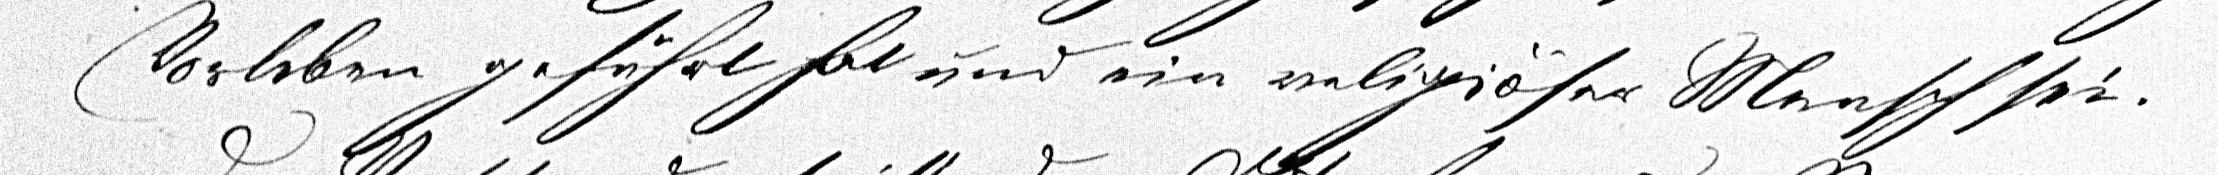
Vorleben geführt hat und ein religiöser Mensch sei.
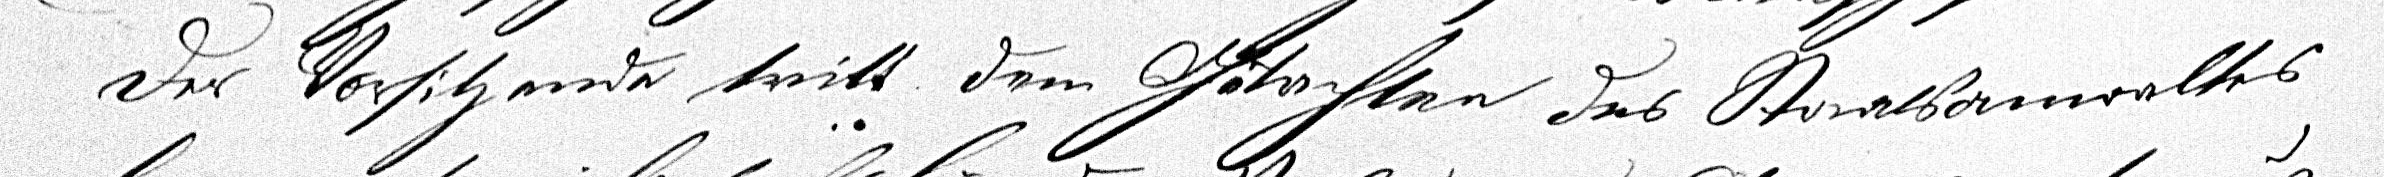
Der Vorsitz ende tritt dem Gutachten des Staatsanwaltes
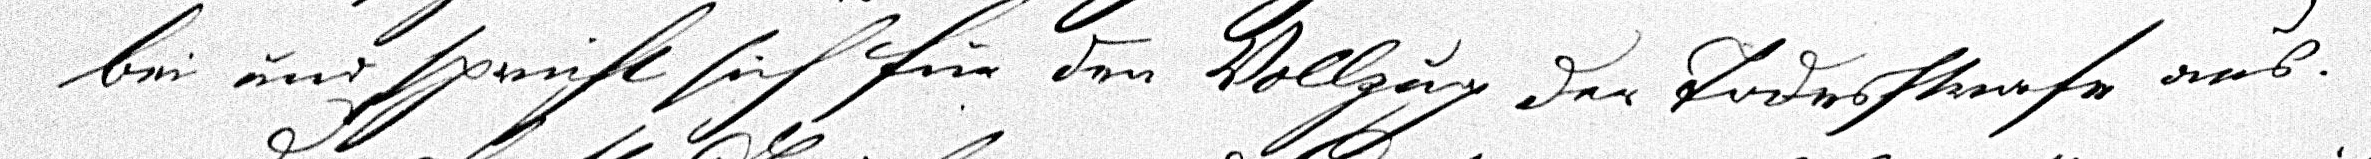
bei und spricht sich für den Vollzug der Todesstrafe aus.
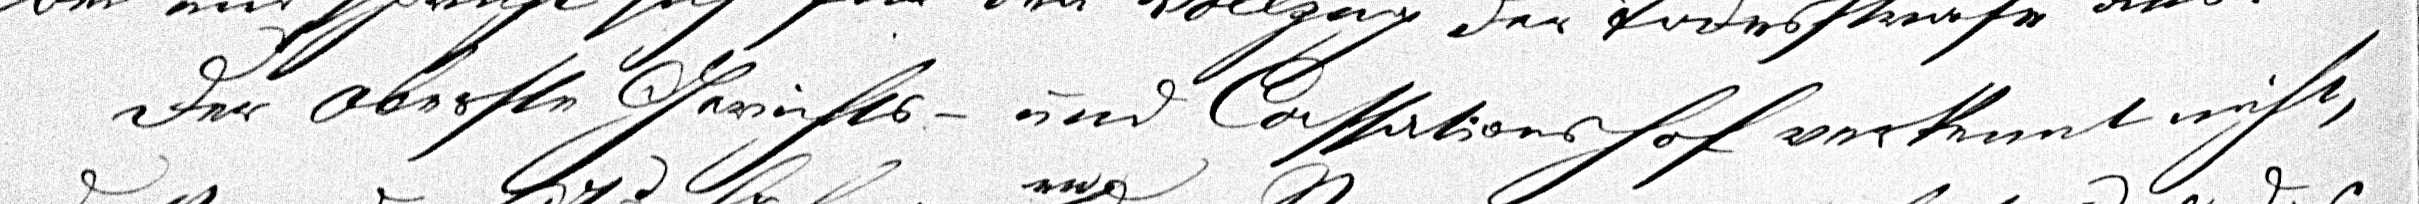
Der oberste Gerichts- und Cassationshof verkennt nicht,
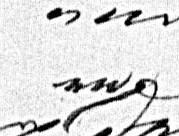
en
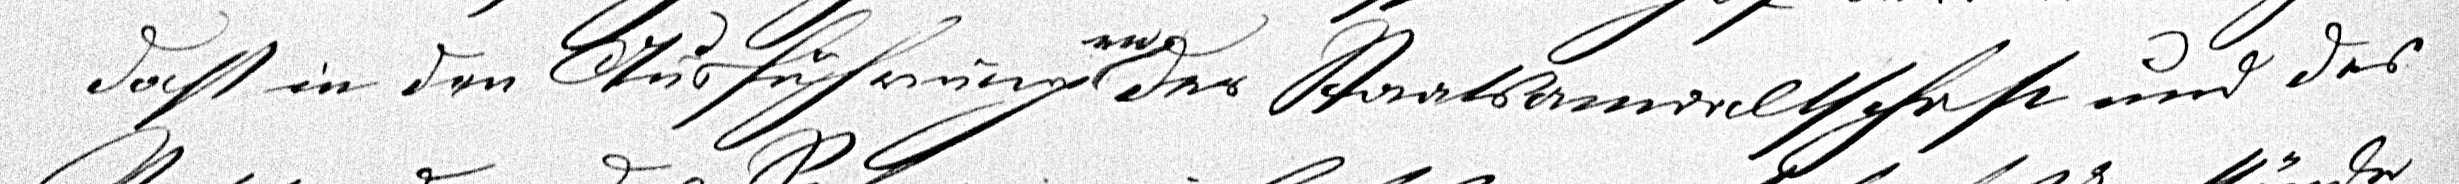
daß in den Ausführung des Staatsanwaltshofe und des
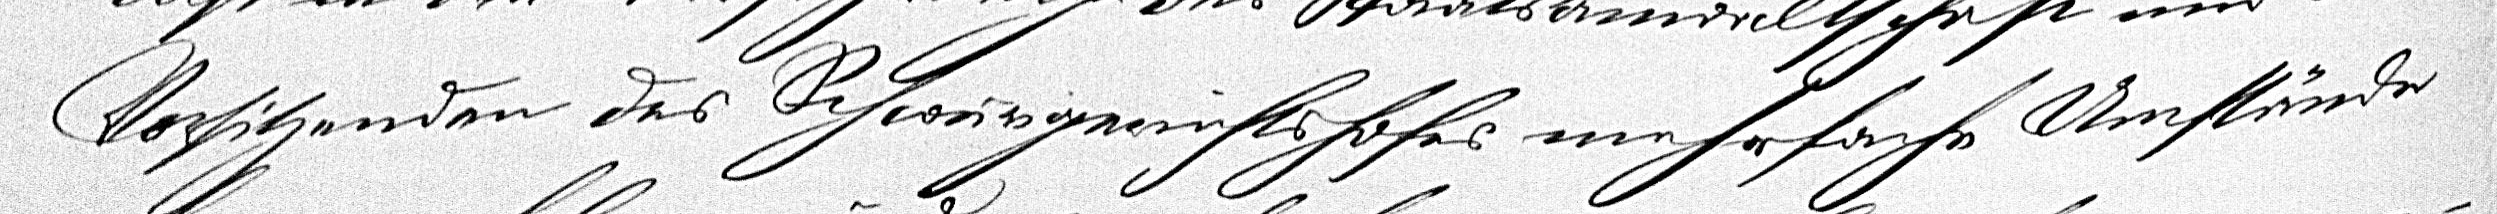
Vorsitzenden des Schwurgerichtshofes mehrfache Umstände
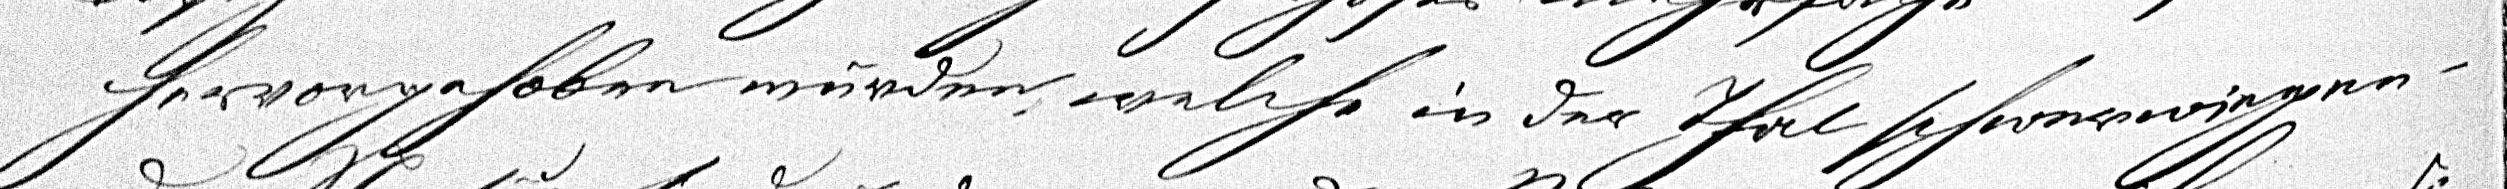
Hervorgehoben wurden, welche in der Thal schwerwiegen -
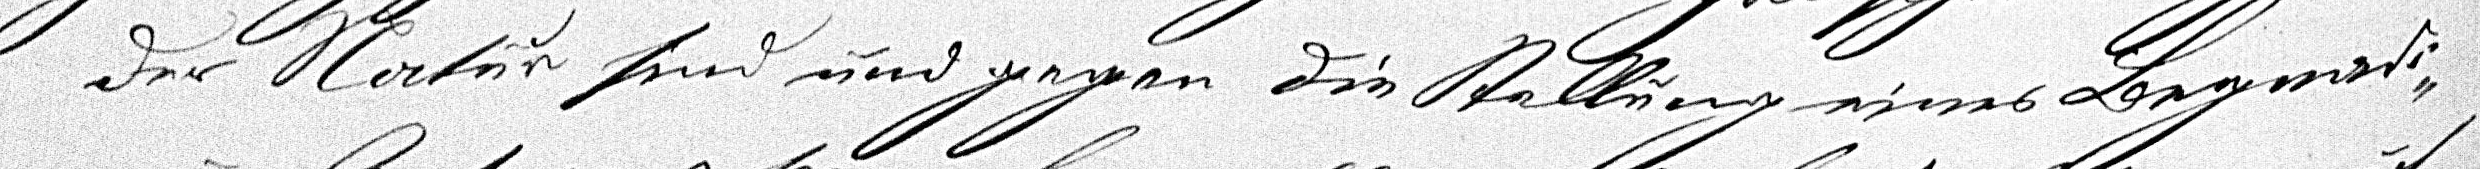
der Natur sind und gegen die Stellung eines Begnadi¬
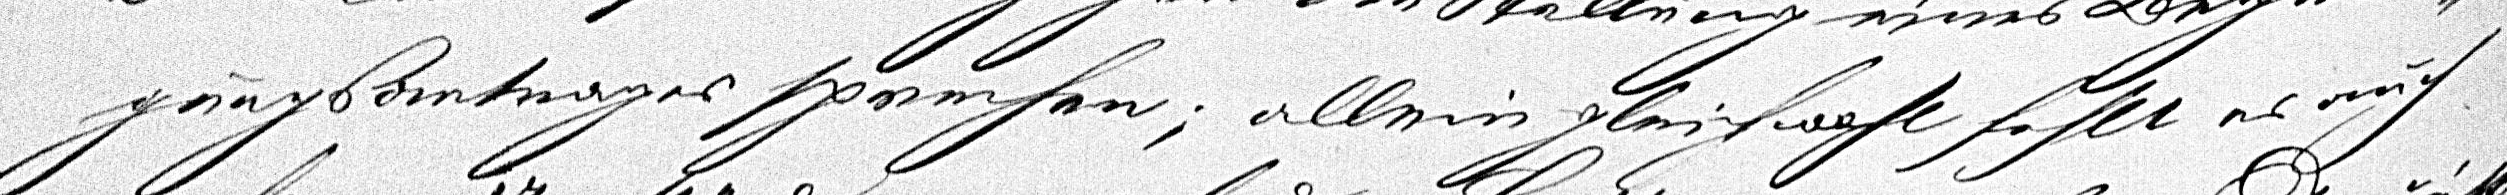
gungsantrages sprechen, allein gleichwohl fehlt es auch
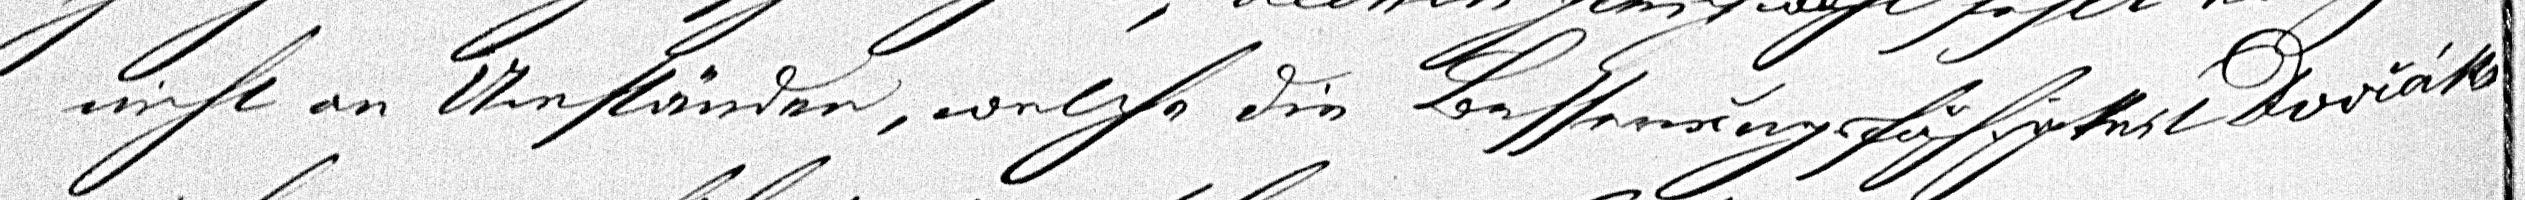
nicht an Umständen, welche die Besserungsfähigstes Dvořák
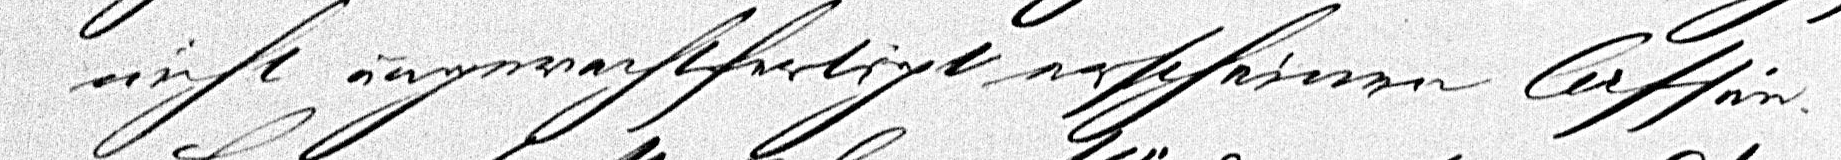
nicht ungerechtfertigt erscheinen Cassin.
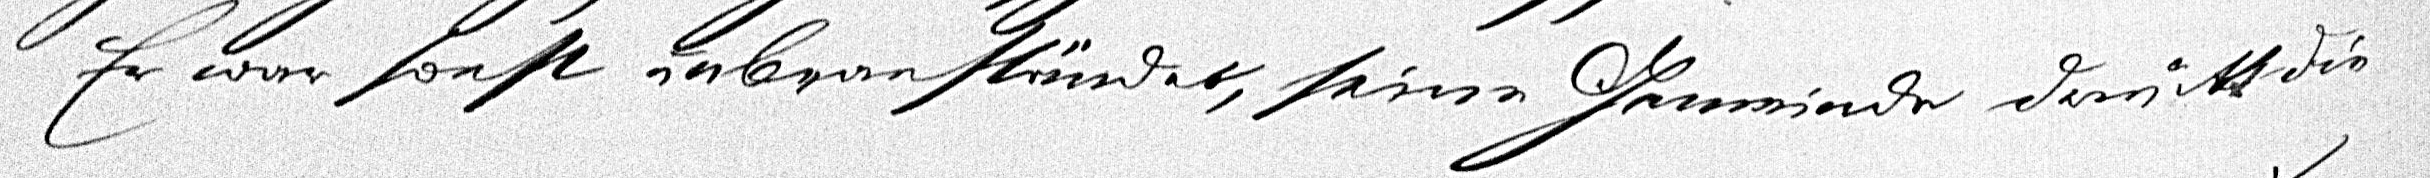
Er war sonst unbeanstründes, seine Gemeinde druck die
